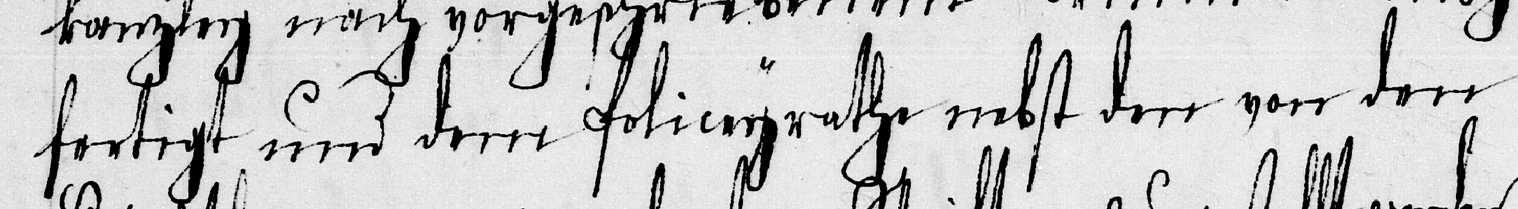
fertigt und dem Policeyrathe nebst den von den
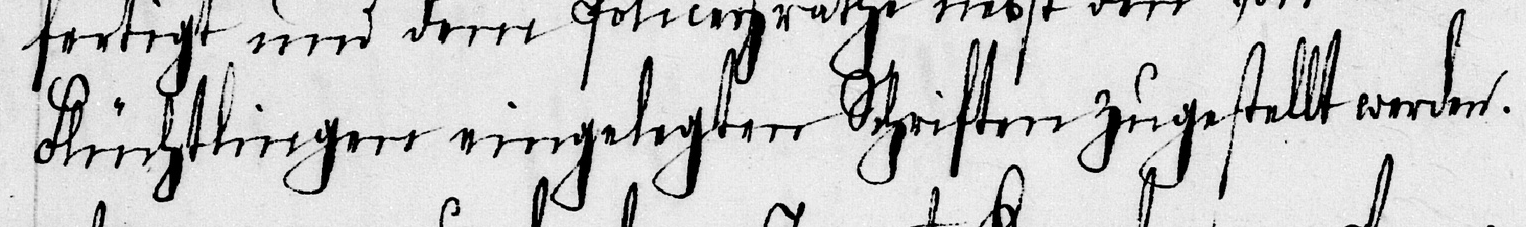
Flüchtlingen eingelegten Schriften zugestellt werden.
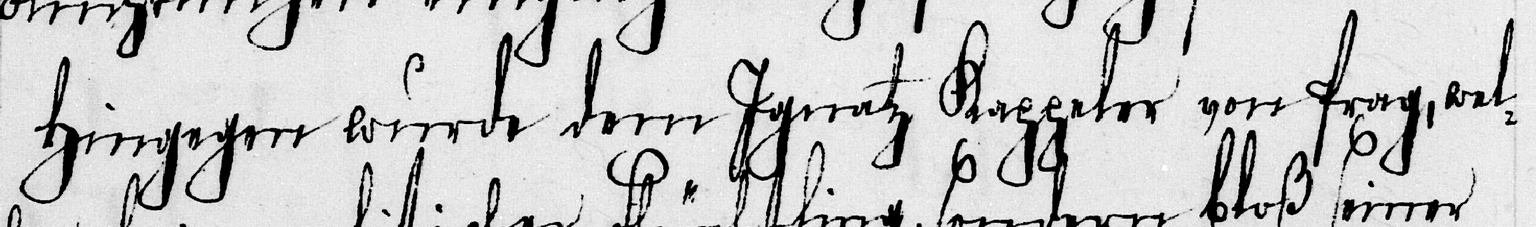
Hingegen wurde dem Ignatz Kappeler von Prag, we¬
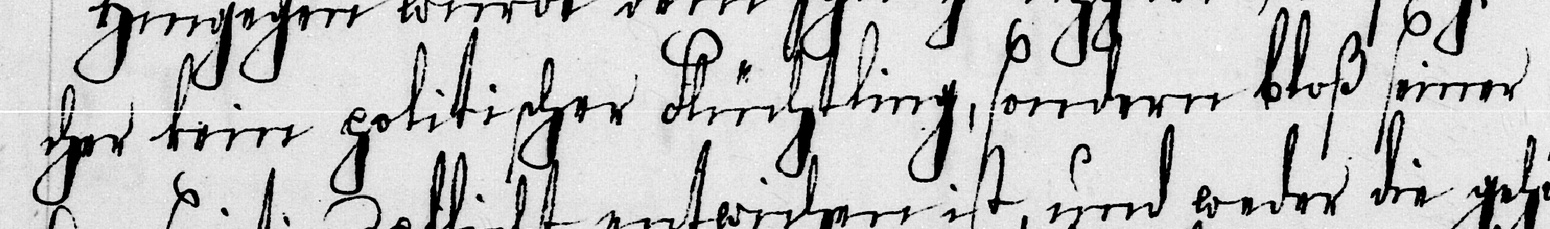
lcher kein politischer Flüchtling, sondern bloß seiner
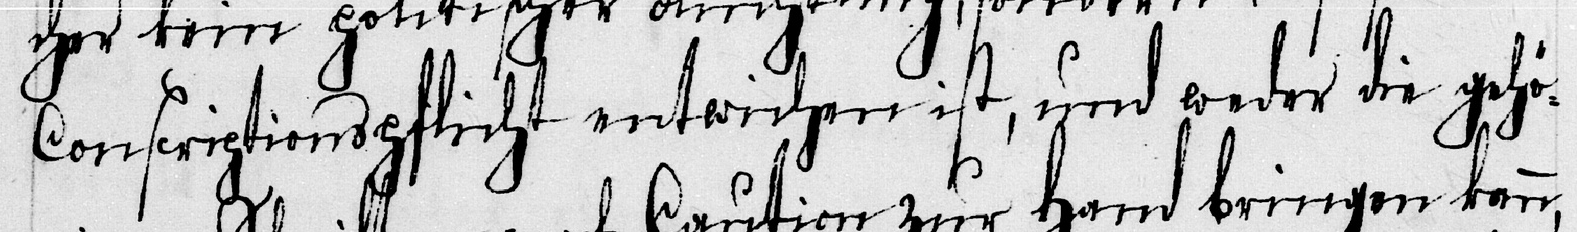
Conscriptionspflicht entwichen ist, und weder die gehö¬
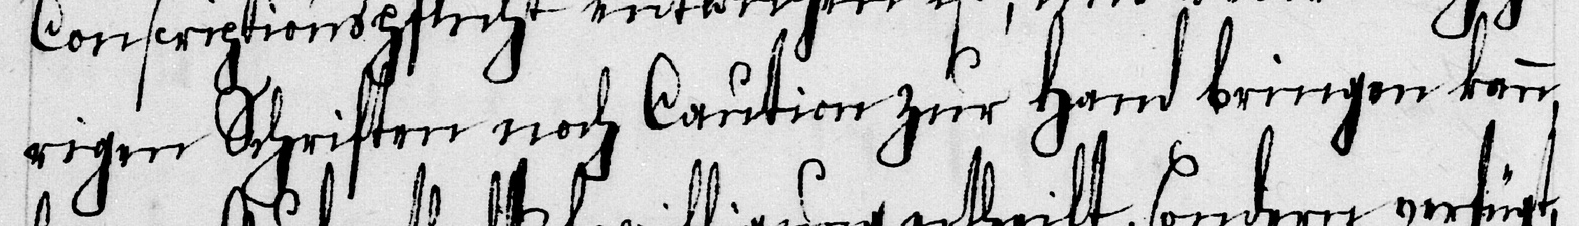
rigen Schriften noch Caution zur Hand bringen kan¬
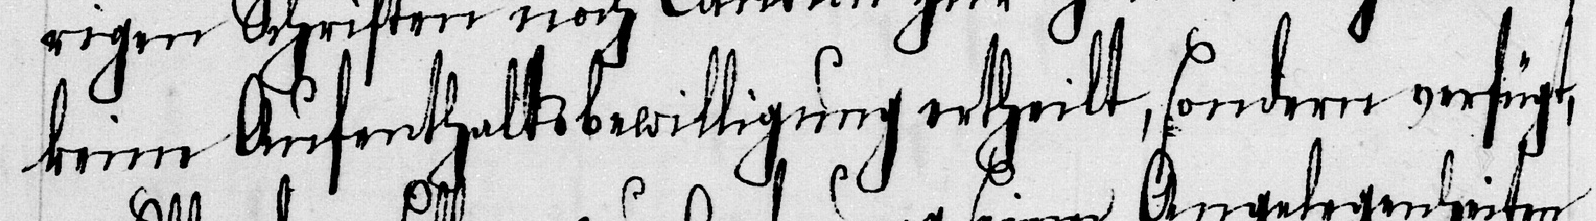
keine Aufenthaltsbewilligung ertheilt, sondern verfüg¬
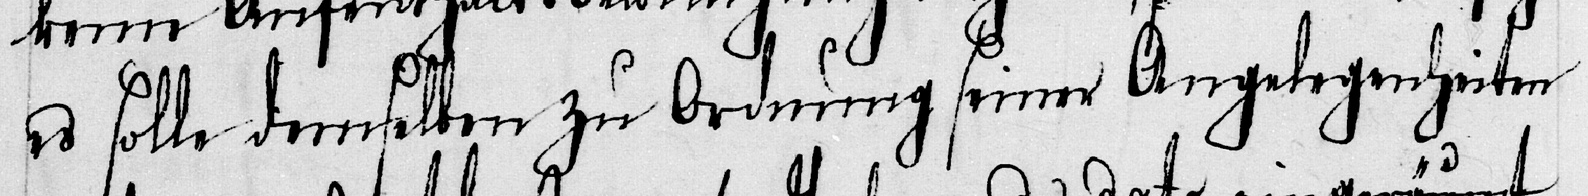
es solle demselben zu Ordnung seiner Angelegenheiten
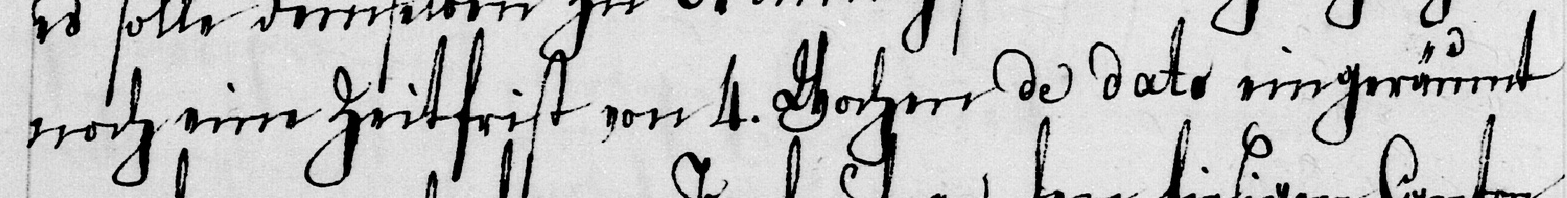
noch eine Zeitfrist von 4. Wochen de dato eingeräumt
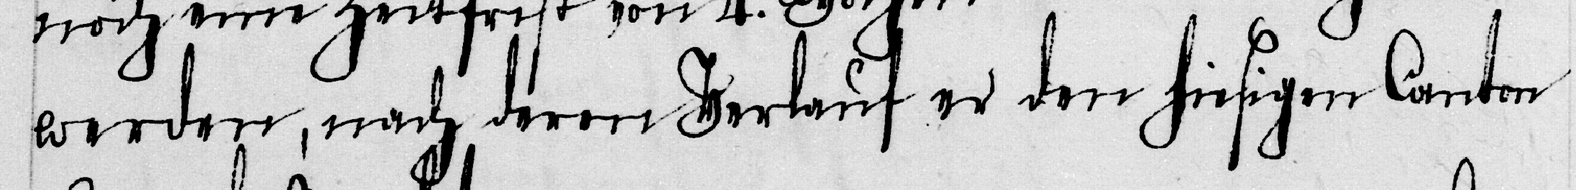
werden, nach deren Verlauf er den hiesigen Canton
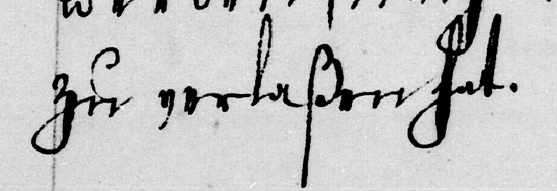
zu verlaßen hat.
